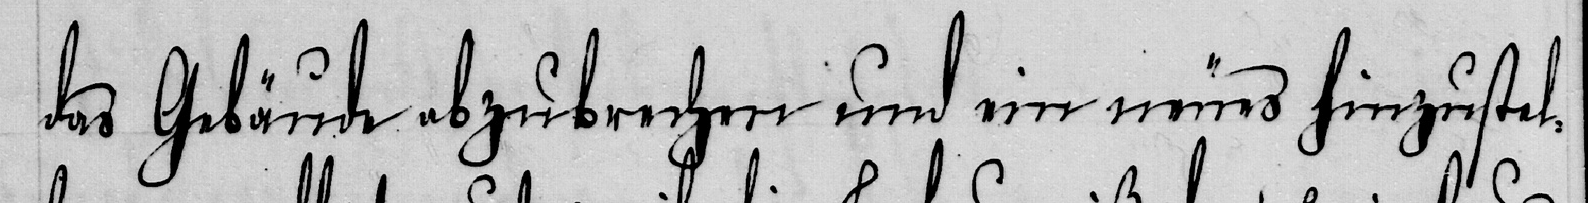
das Gebäude abzubrechen und ein neues hinzustel¬
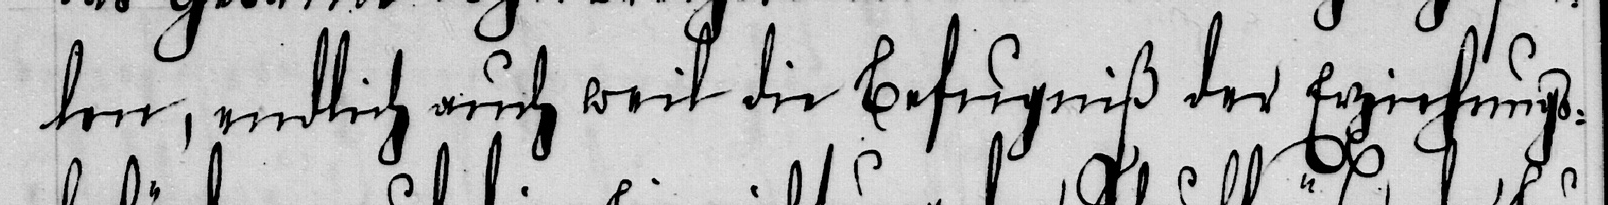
len, endlich auch weil die Befugniß der Erziehungs¬
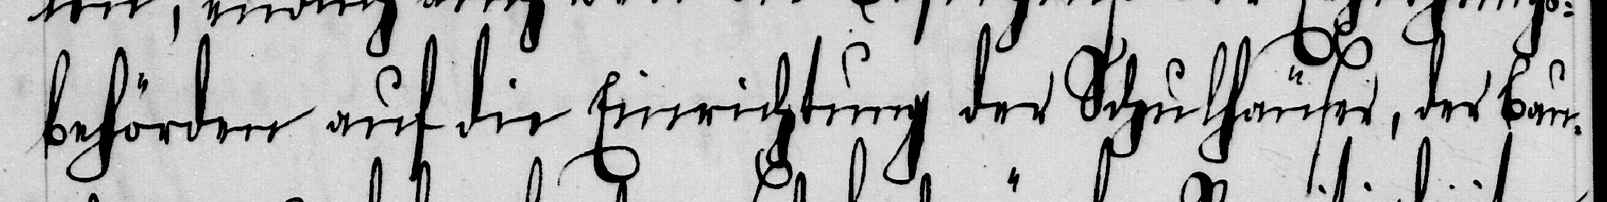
behörde auf die Einrichtung der Schulhäuser, der Bau¬
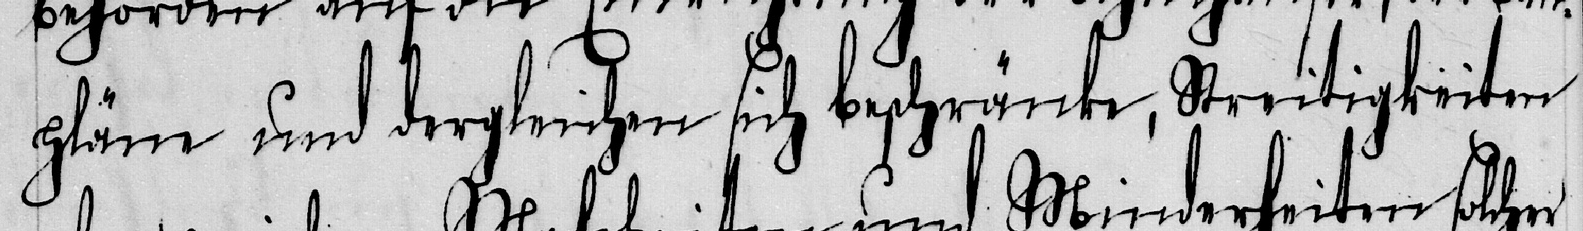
pläne und dergleichen sich beschränke, Streitigkeiten
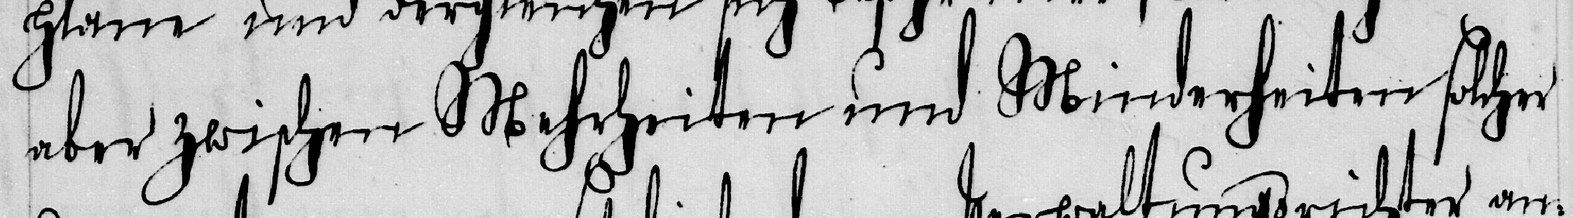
aber zwischen Mehrheiten und Minderheiten solcher
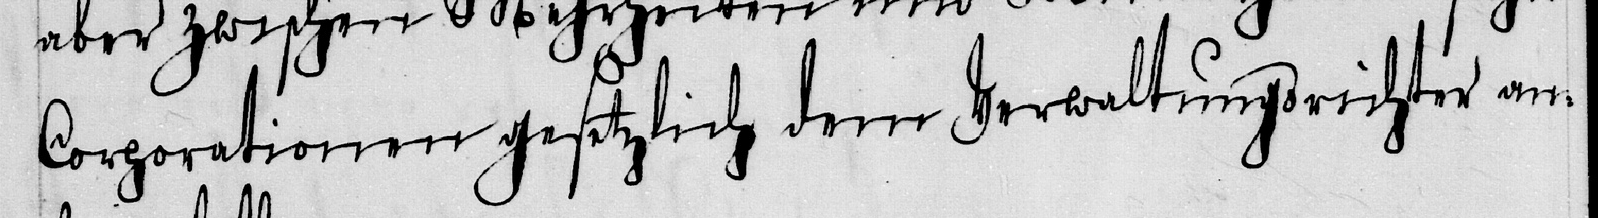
Corporationen gesetzlich dem Verwaltungsrichter an¬
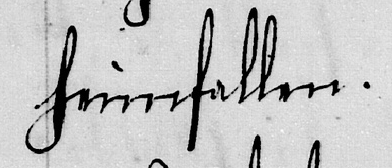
hinfallen.
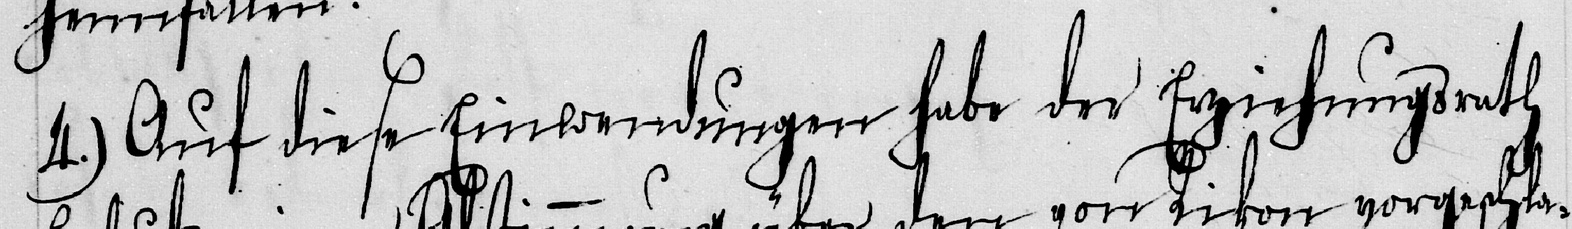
4.) Auf diese Einwendungen habe der Erziehungsrath
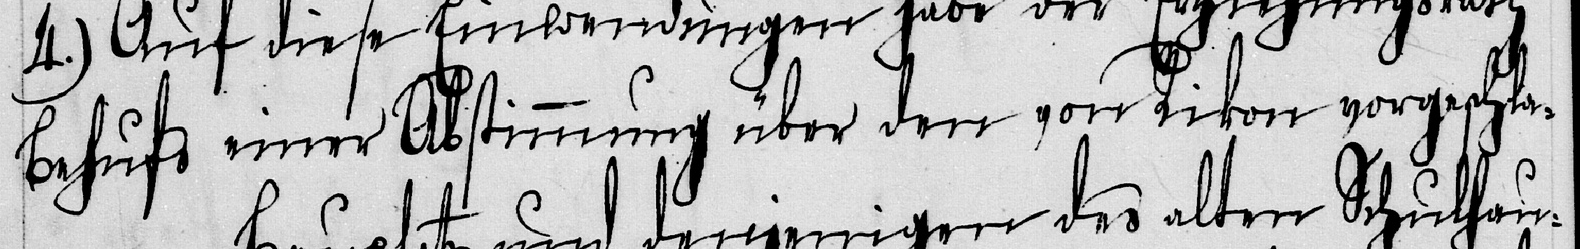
Behufs einer Abstimmung über den von Rikon vorgeschla¬
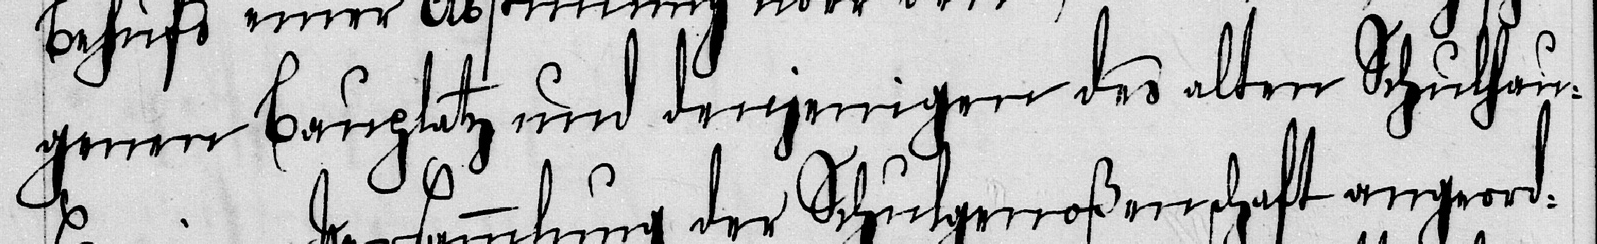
genen Bauplatz und denjenigen des alten Schulhau¬
